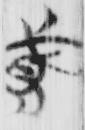○（貸）
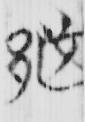○（越）
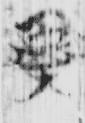異
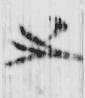之
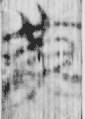黃
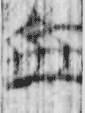金
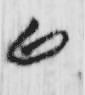㠯（以）
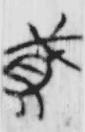○（貸）
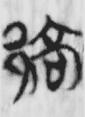鄗
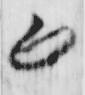㠯（以）
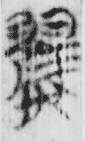○（糴）
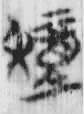穜（種）
